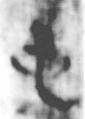屯
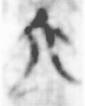六
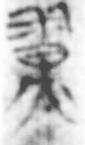翼
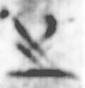之
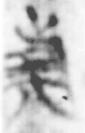○（旗）
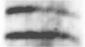二
